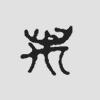萬
